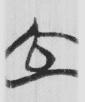立
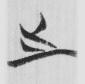之
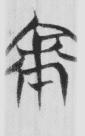{宀𠂔}
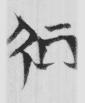凥
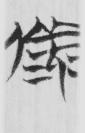備
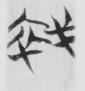{衣弋}
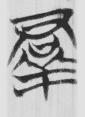羣
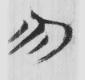勿
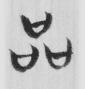品
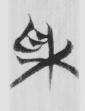采
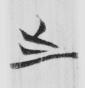之
